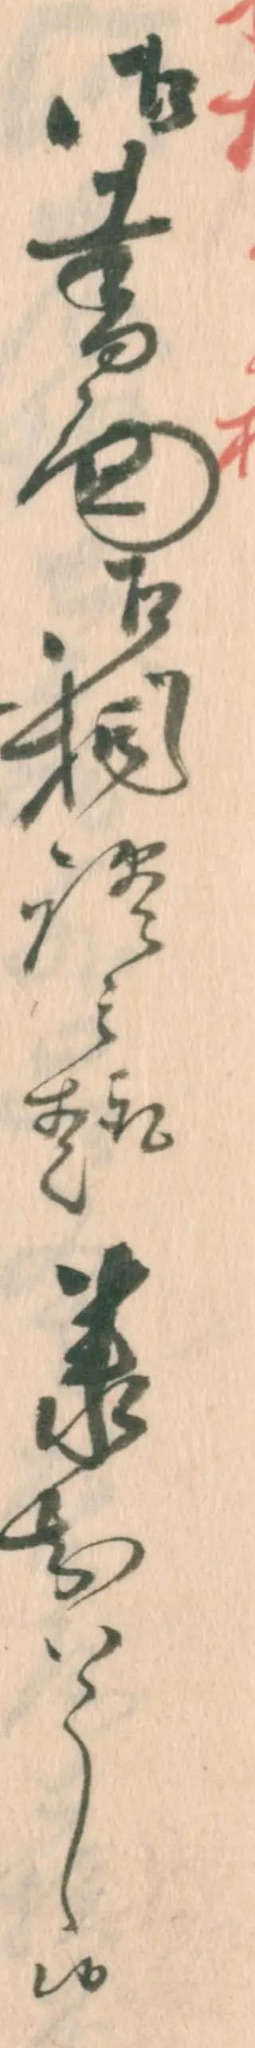御書面御相談之趣承知いたし候
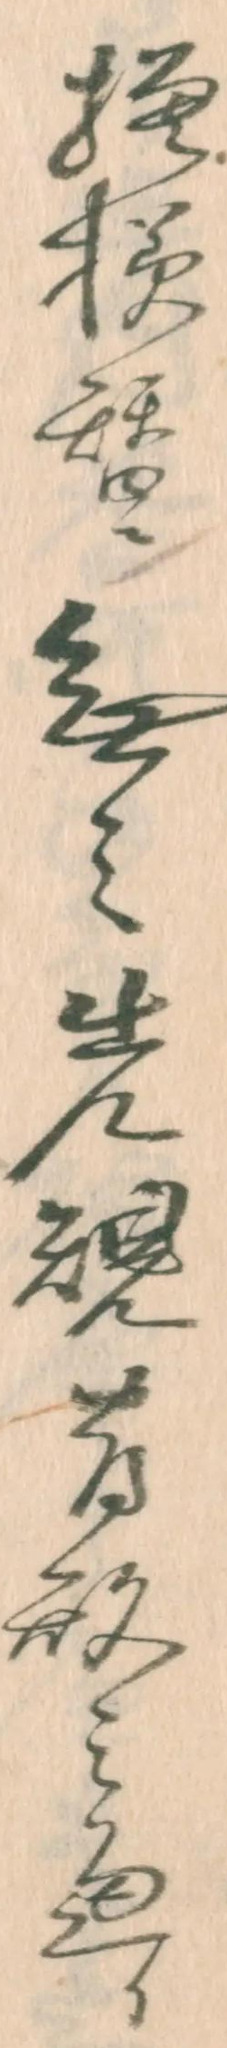模様替ニ無之先規有形之通リ
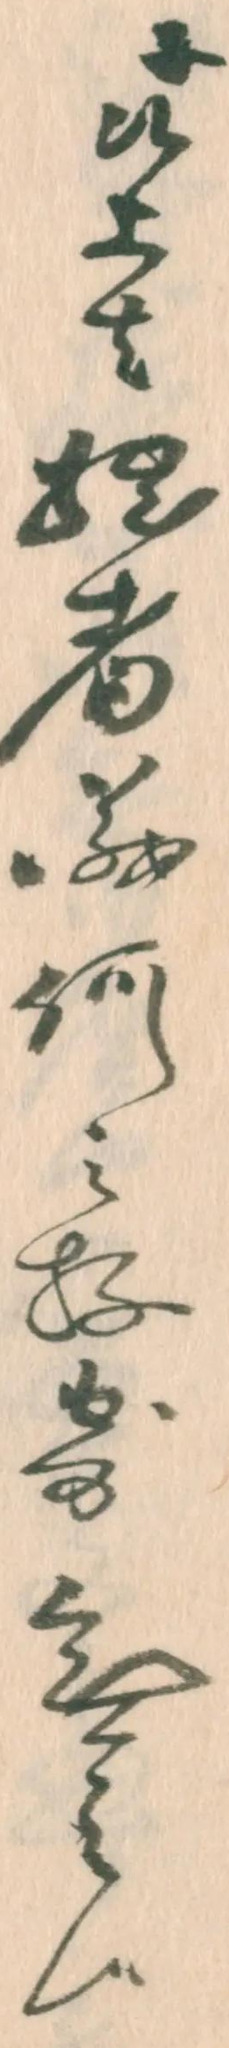に候上は拙者儀何之存寄無之候
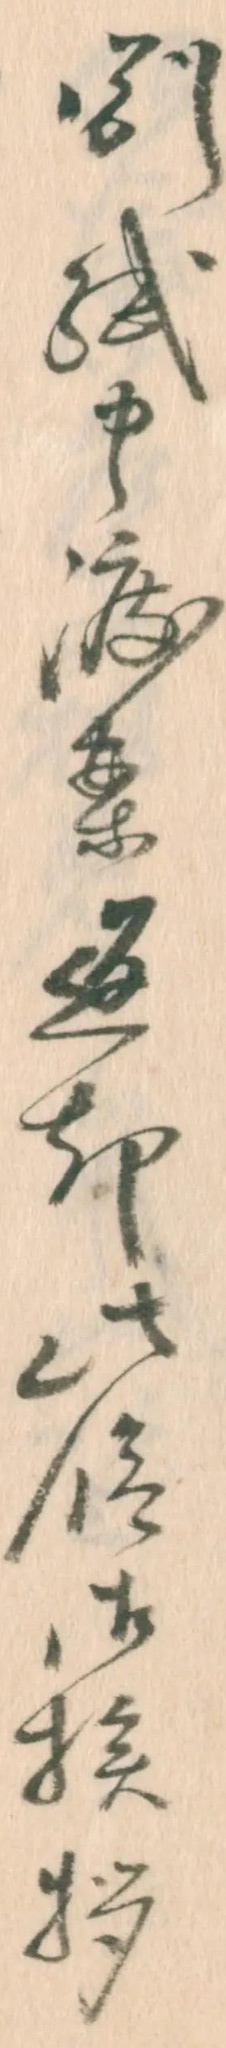別紙申渡案返却此段御挨拶
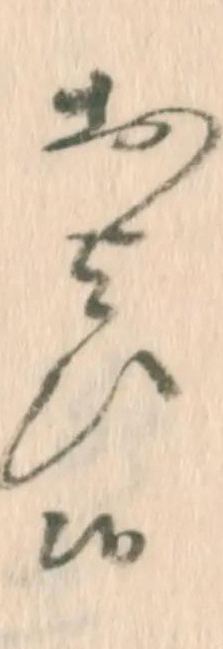およひ候
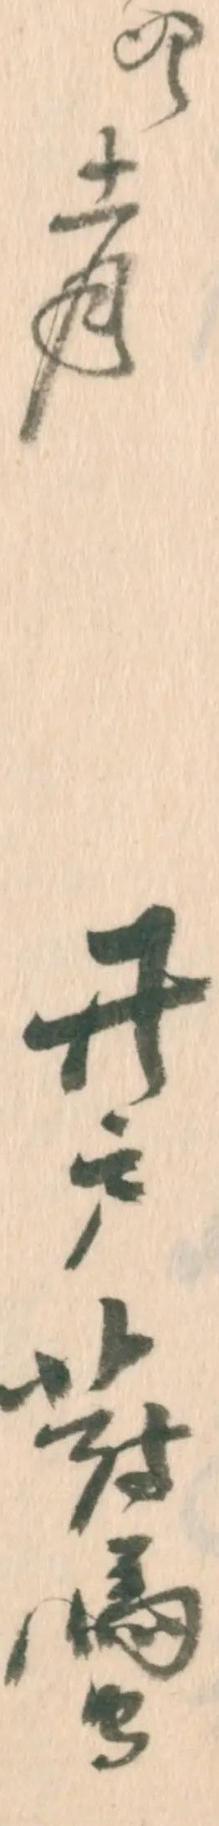十一月井戸対馬守

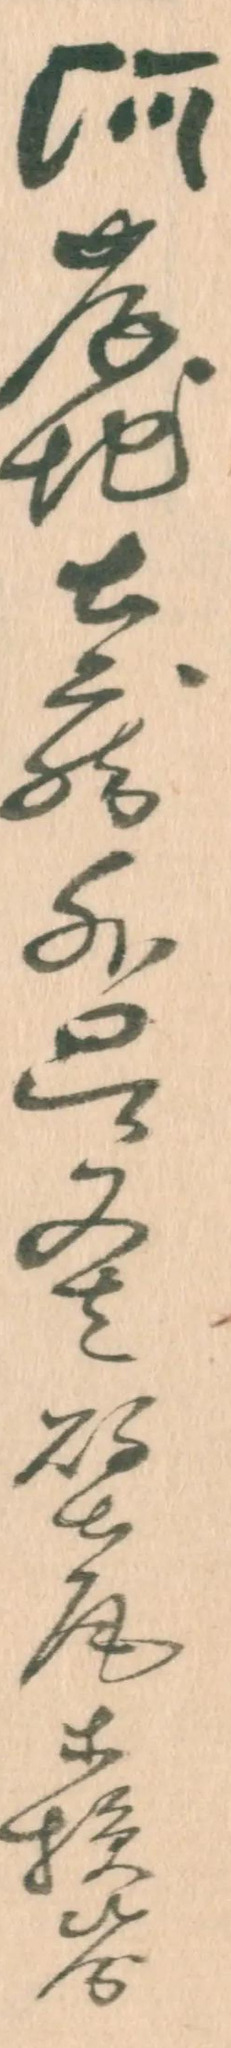河岸地土蔵外廻リ又は壁瓦等損候分
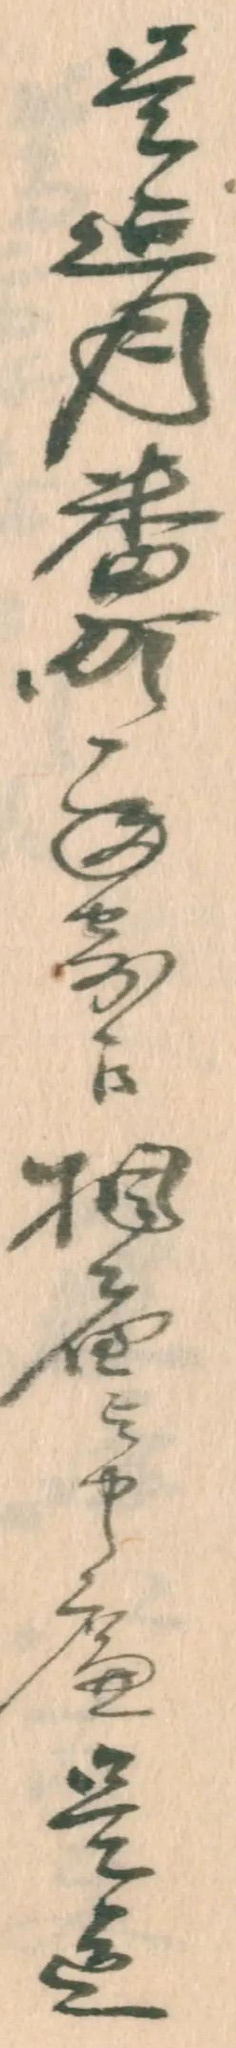是迄月番町年寄え相届与申廉是迄
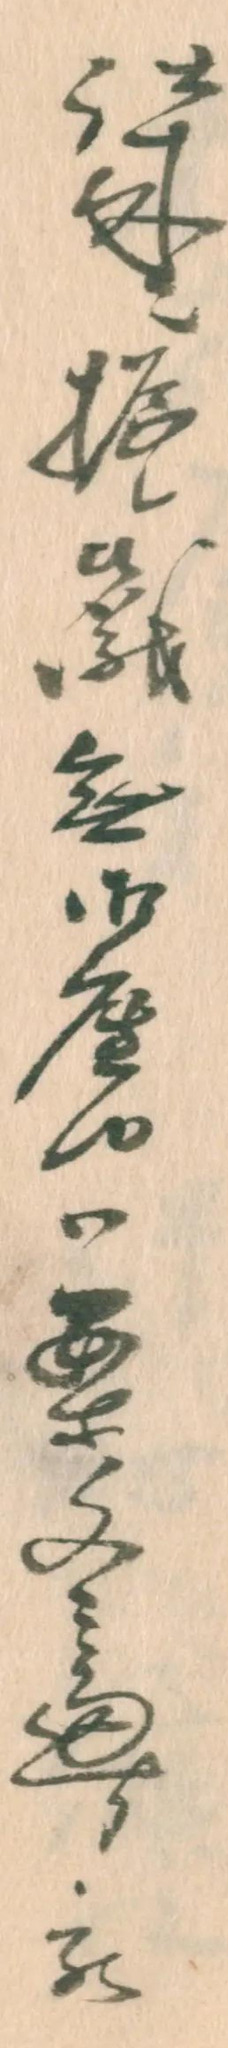仕来ニ振レ候儀無御座候御案文之通リ被
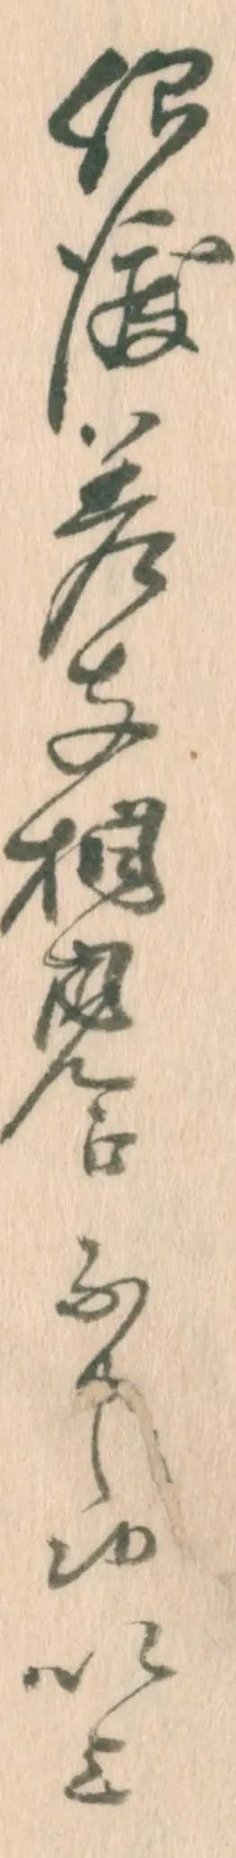仰渡差支相見え不申候以上
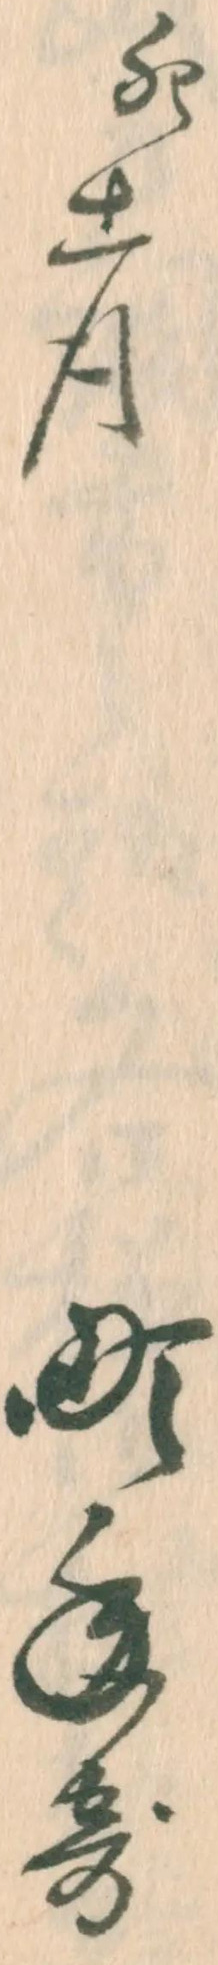卯十一月町年寄

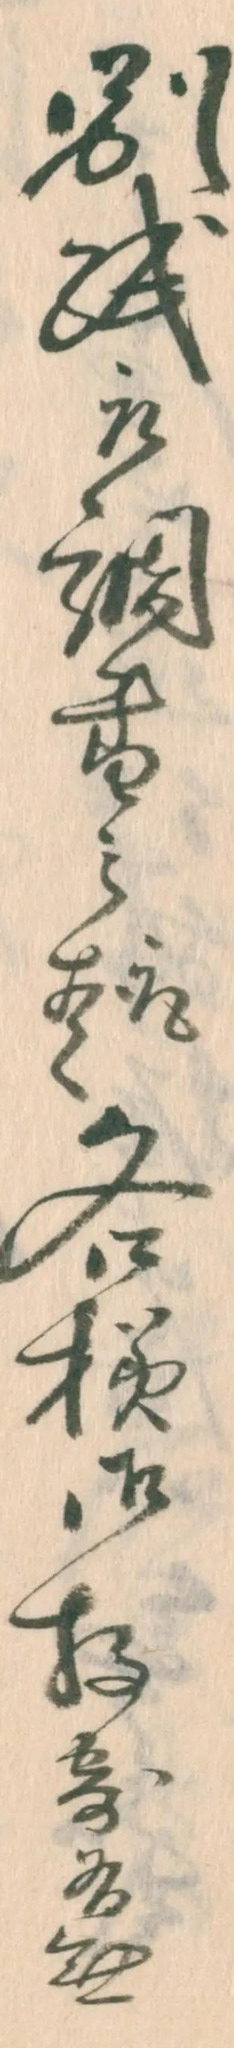別紙取調書之趣各様御存寄有無
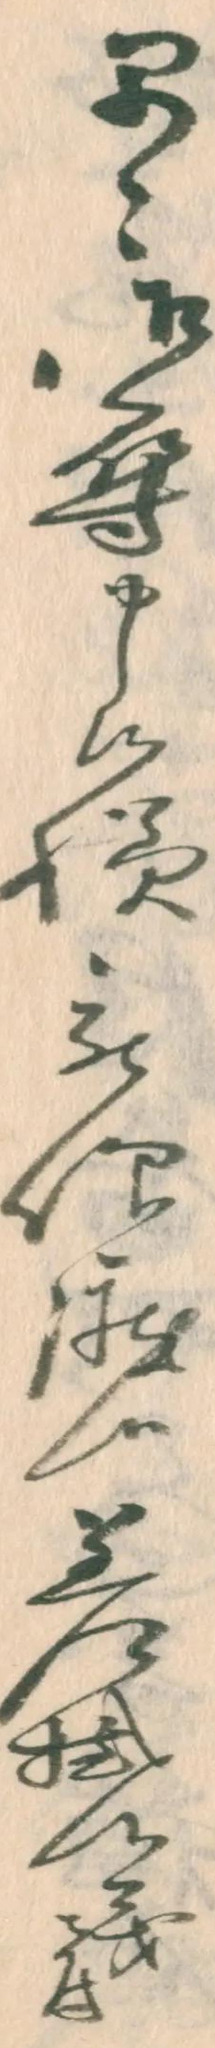早々御尋申候様被仰渡候差掛候義ニ付
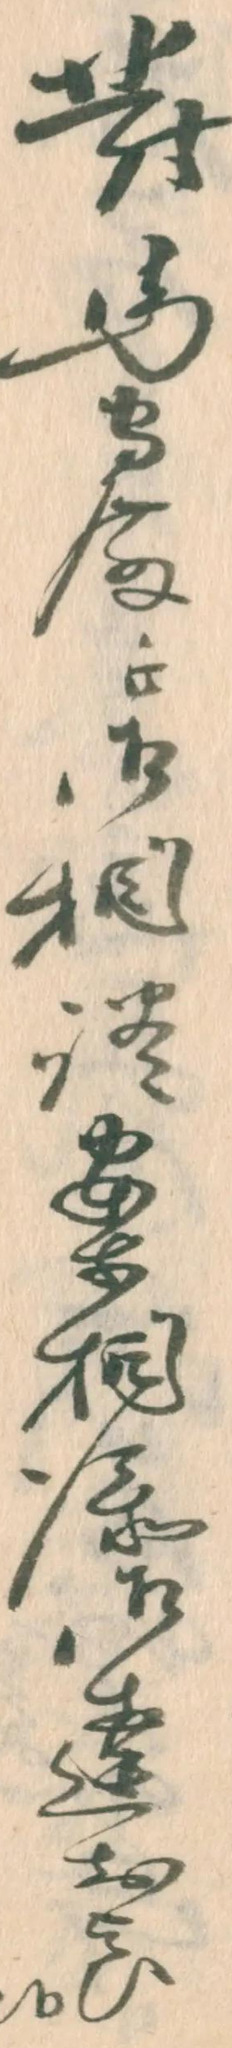対馬守殿被御相談案相添御達およひ候

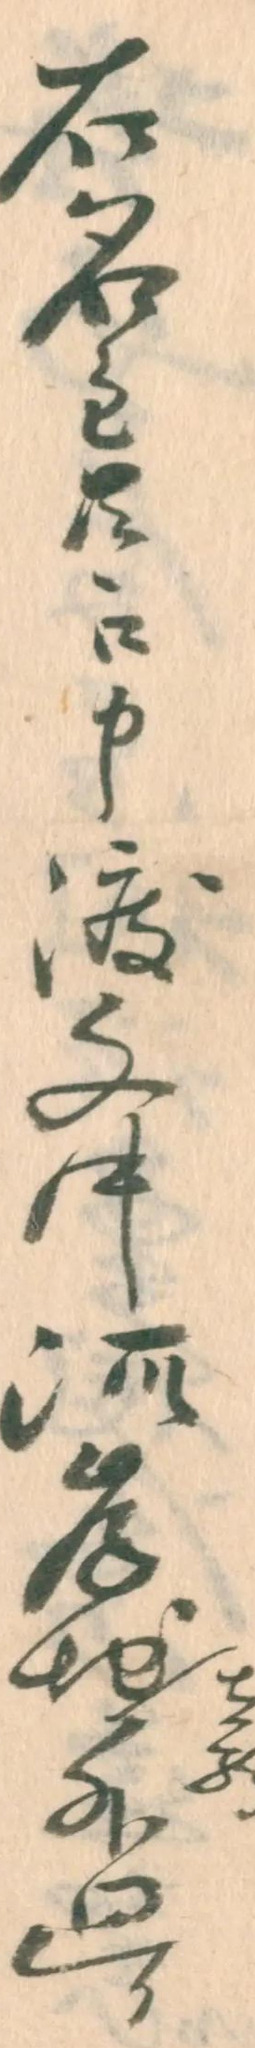右名主共え申渡文中河岸地土蔵外廻リ
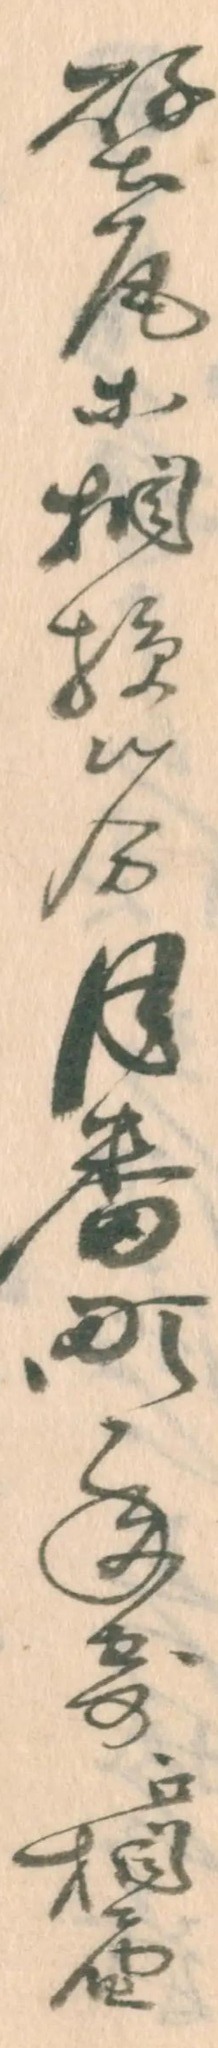壁瓦等相損候分月番町年寄え相届
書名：地震災書留 2巻. [1] 内表紙に「地震災書留　安政二卯年　但本所深川御用屋敷地代免除調」とあり
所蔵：国立国会図書館 National Diet Library, JAPAN
